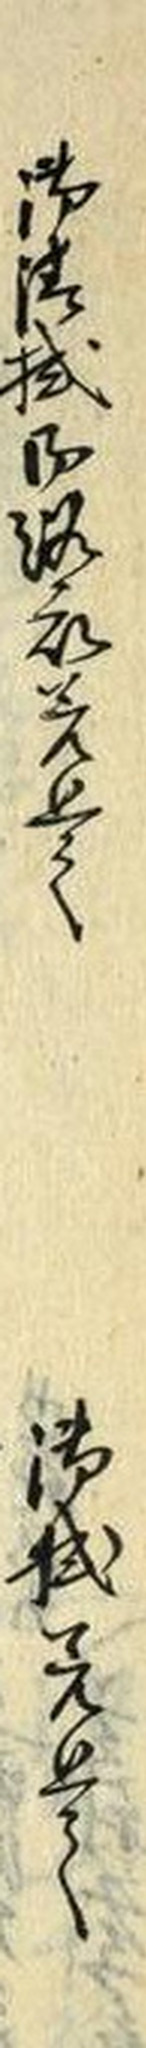御清拭御浴衣差上之御拭差上之
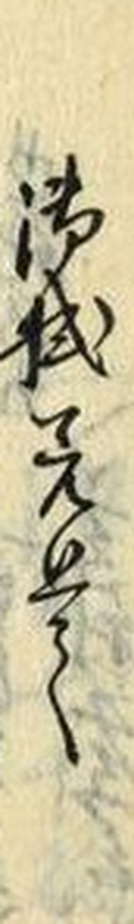御櫛差上之
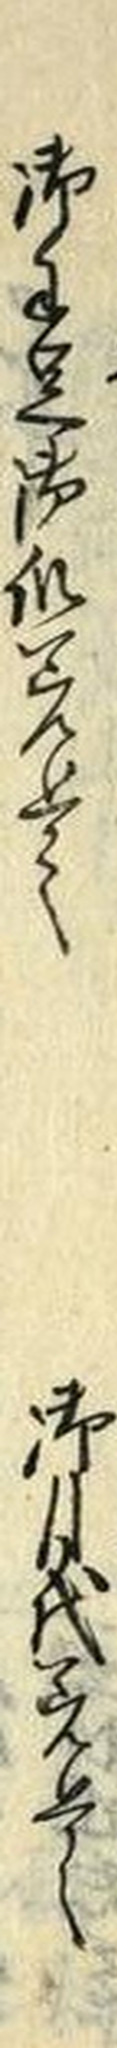御手足御爪差上之御月代差上之
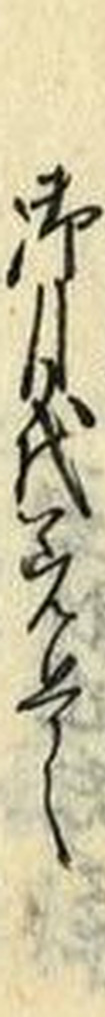御櫛差上之
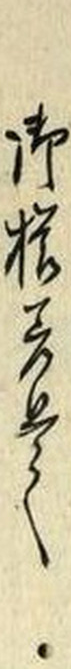御櫛差上之
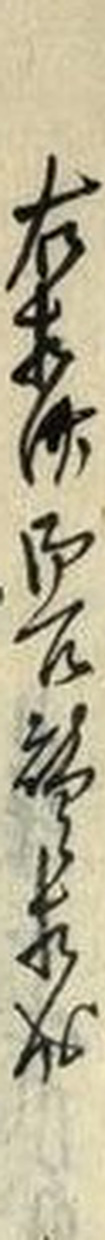右相済御召替ニ相成
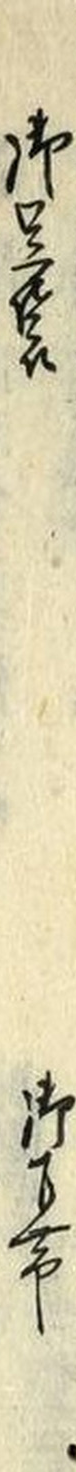御足袋御下帯
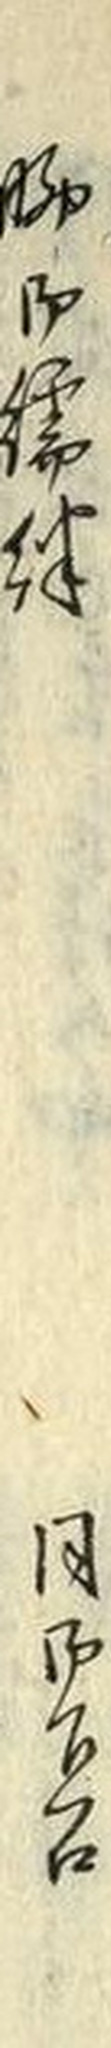脇御襦袢同御下召
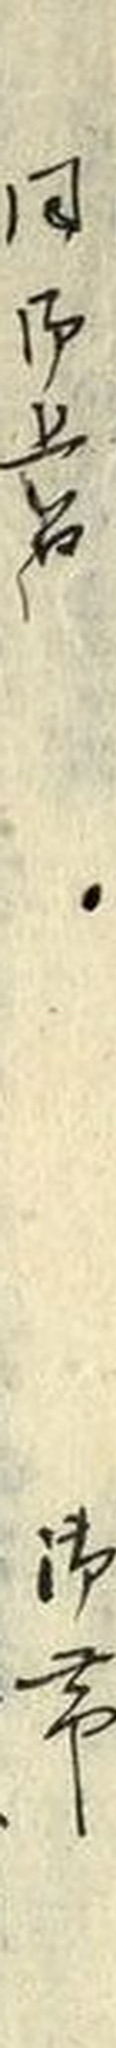同御上召御帯
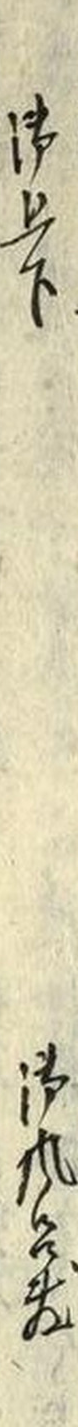御上下御風呂敷
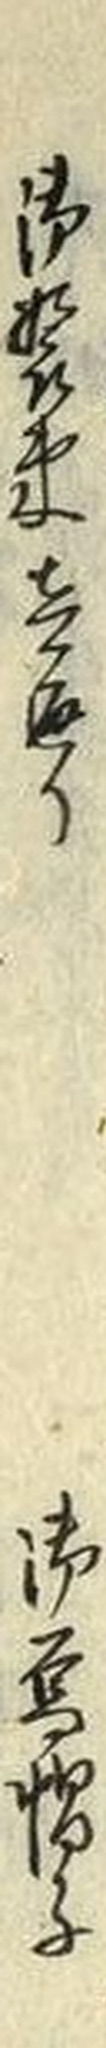御装束壱通り御烏帽子
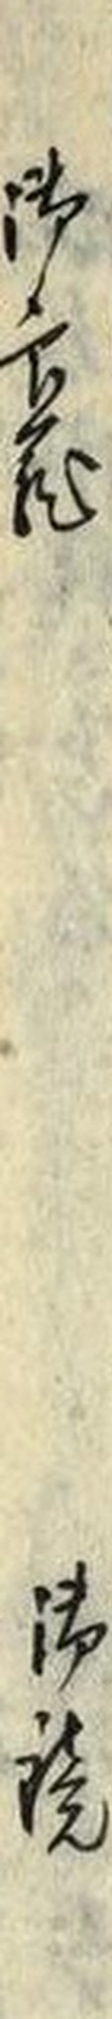御印籠御鏡
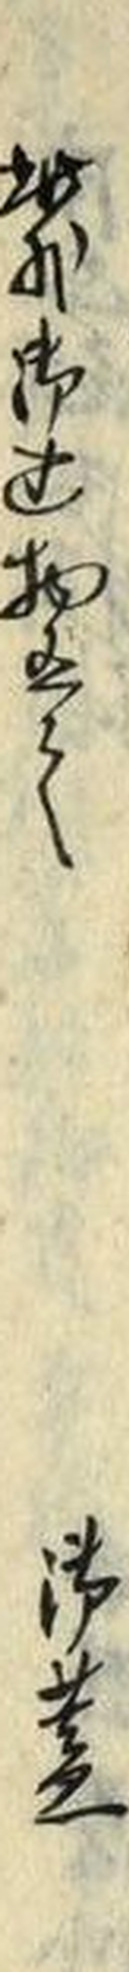此外御込物有之御蓋

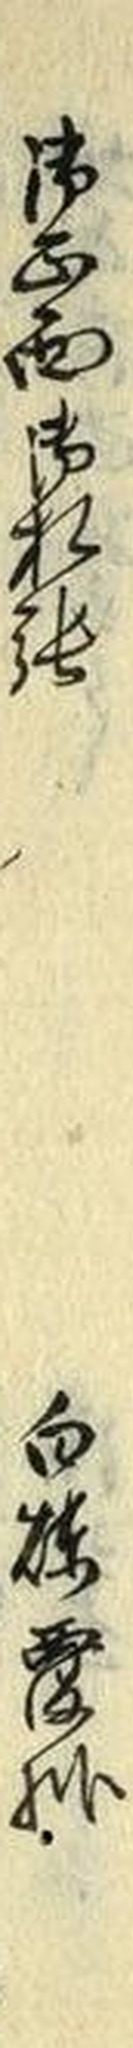御正面御札張白煉覆掛
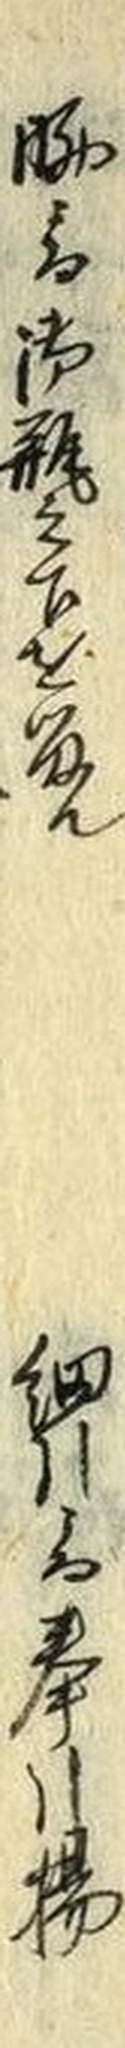脇ニ而御瓶之下を留ル細引ニ而奉引揚
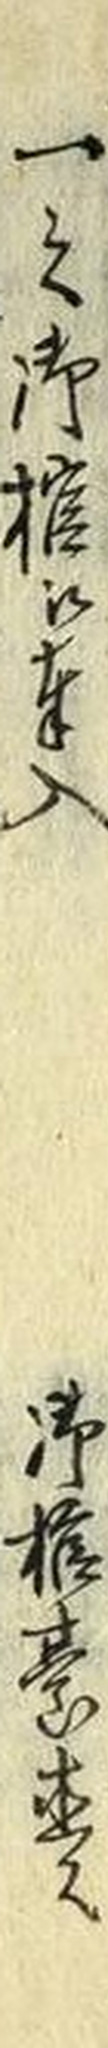一之御棺江奉入御棺台直ス
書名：少傅日録抄（斉善付側向頭取日記、江戸并道中、初入在国、逝去後…
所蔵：福井県文書館 Fukui Prefectural Archives
